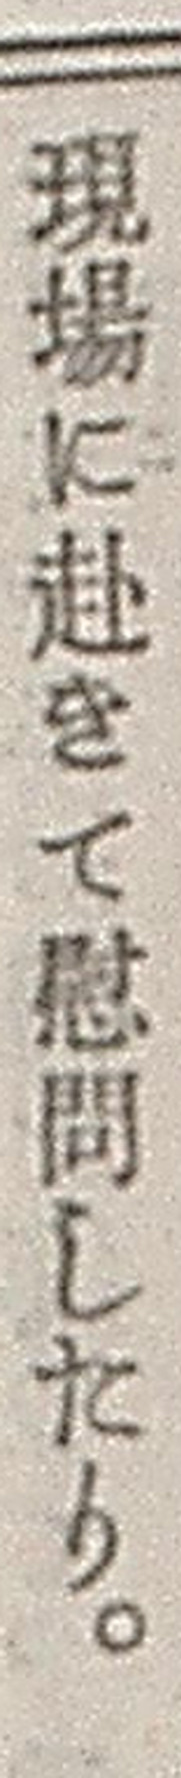現場に赴きて慰問したり。
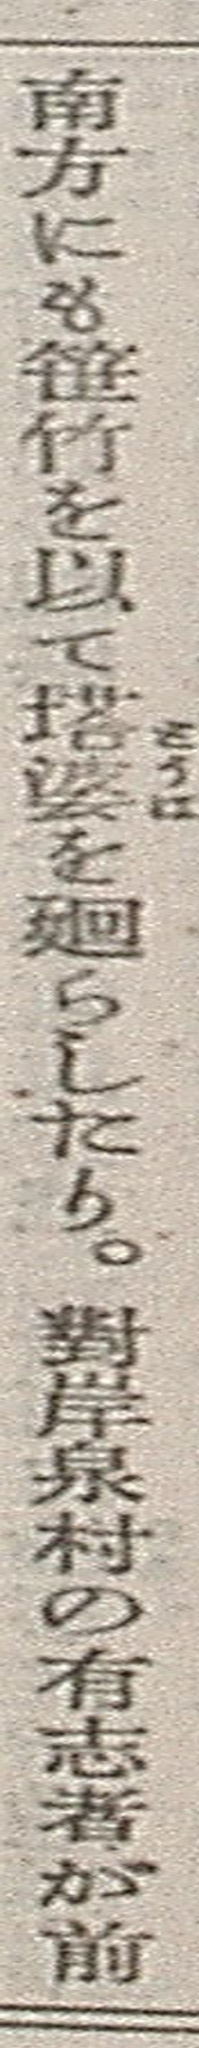南方にも笹竹を以て塔婆を廻らしたり。対岸泉村の有志者が前

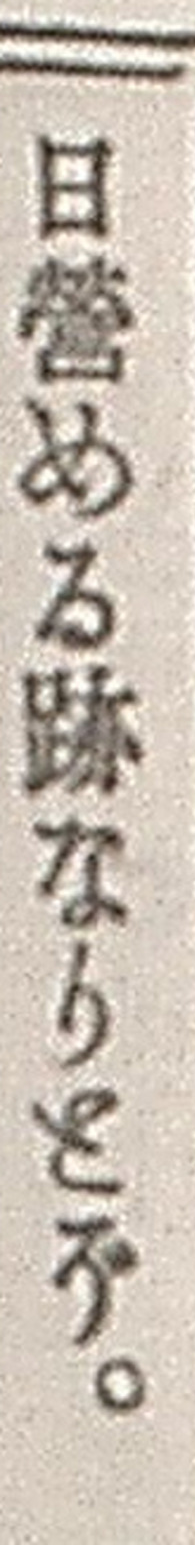日営める跡なりとぞ。
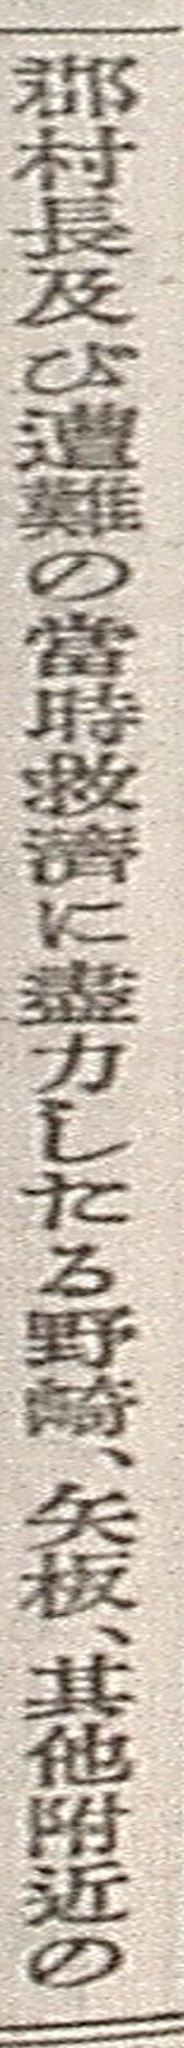郡村長及び遭難の当時救済に尽力したる野崎、矢板、其他附近の
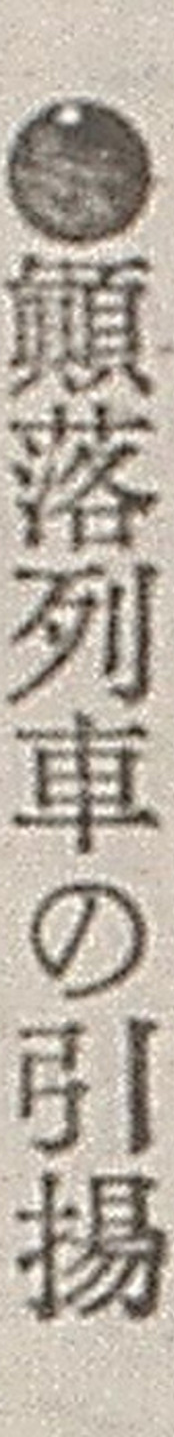●顛落列車の引揚
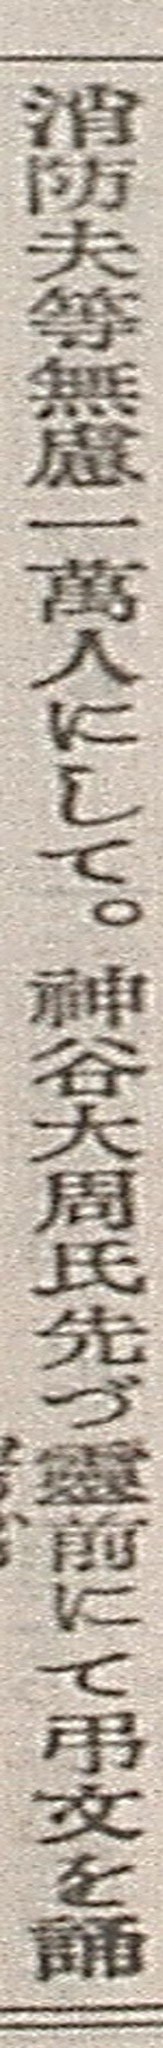消防夫等無慮一万人にして。神谷大周氏先づ霊前にて弔文を誦
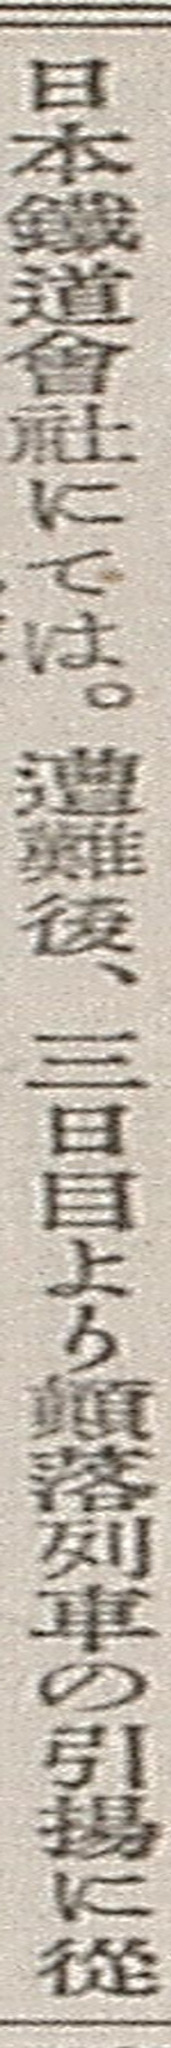日本鉄道会社にては。遭難後、三日目より顛落列車の引揚に従
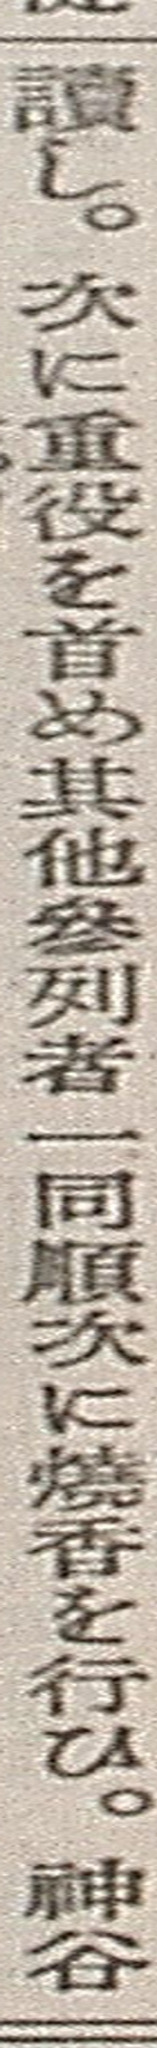読し。次に重役を首め其他参列者一同順次に焼香を行ひ。神谷
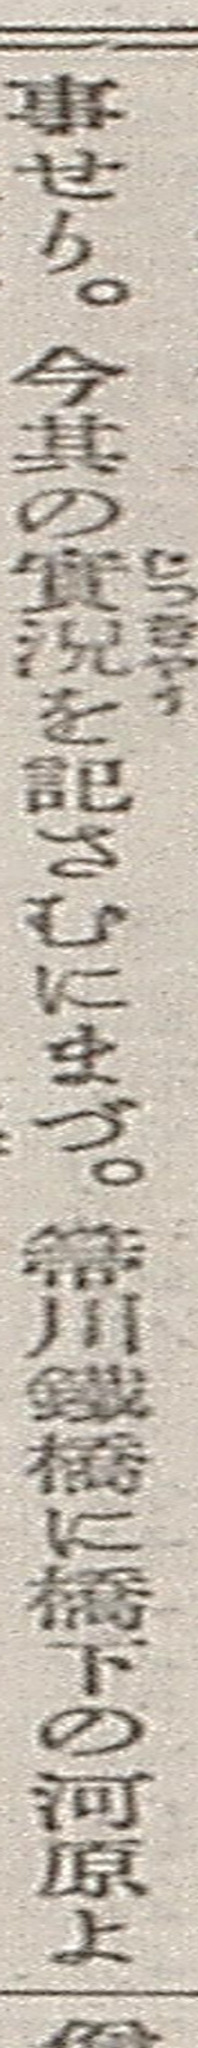事せり。今其の実況を記さむにまづ。箒川鉄橋に橋下の河原よ
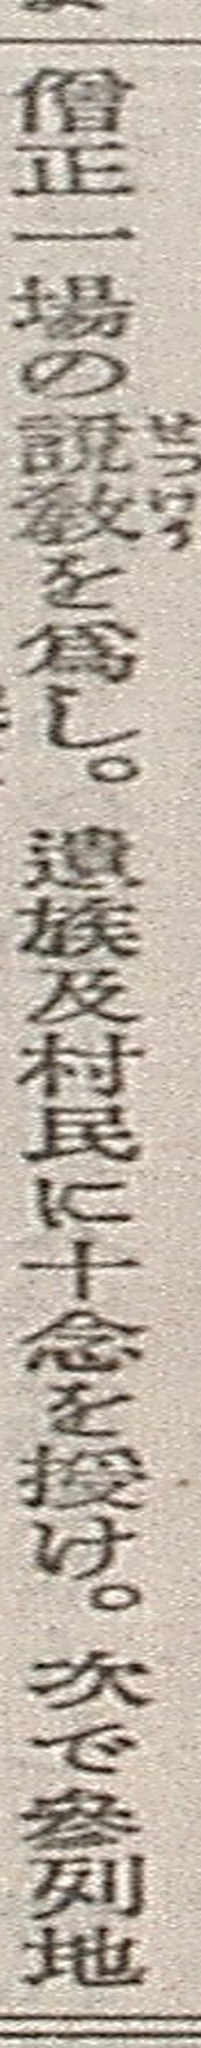僧正一場の説教を為し。遺族及村民に十念を授け。次で参列地
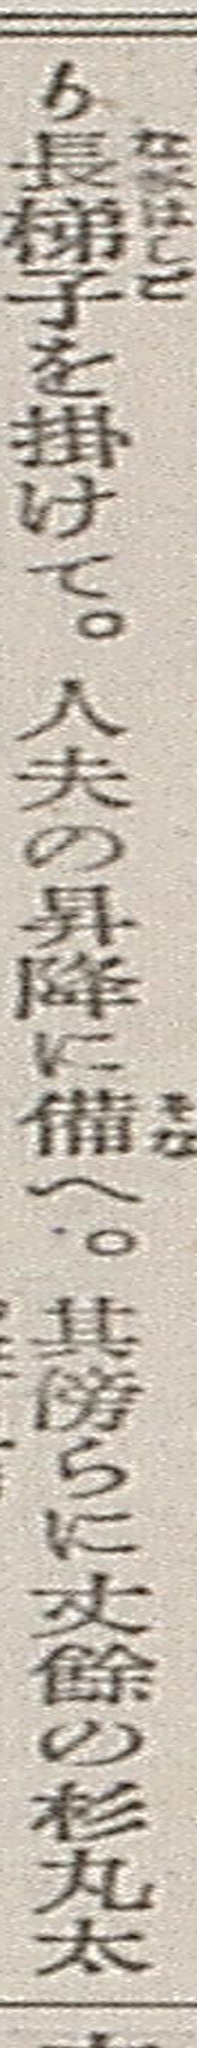り長梯子を掛けて。人夫の昇降に備へ。其傍らに丈余の杉丸太
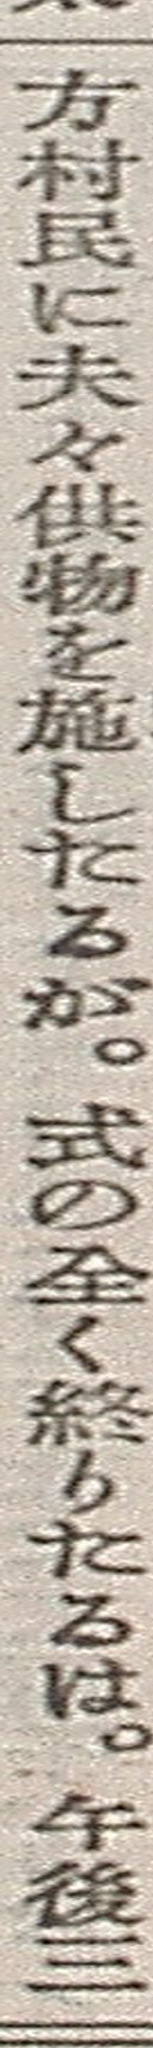方村民に夫々供物を施したるが。式の全く終りたるは。午後三
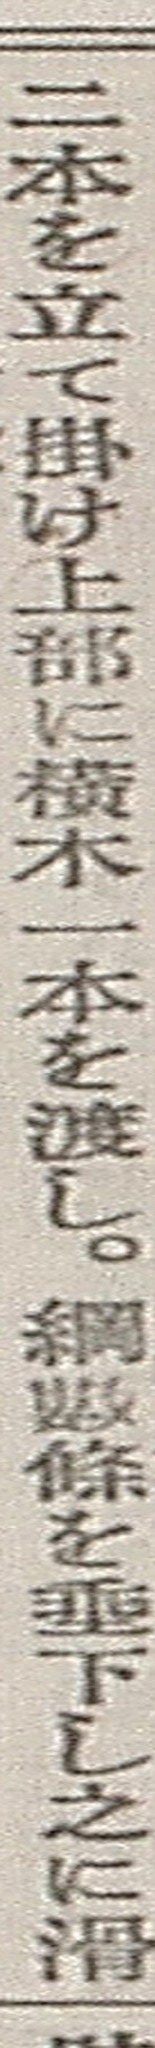二本を立て掛け上部に横木一本を渡し。綱数条を垂下し之に滑
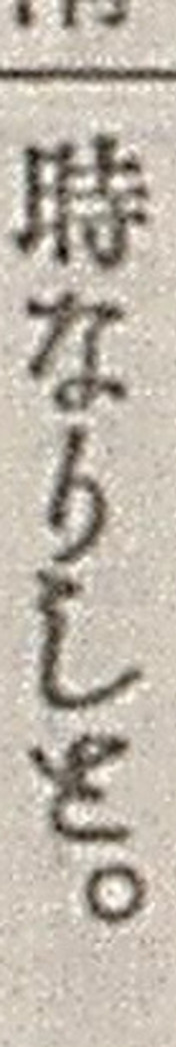時なりしと。
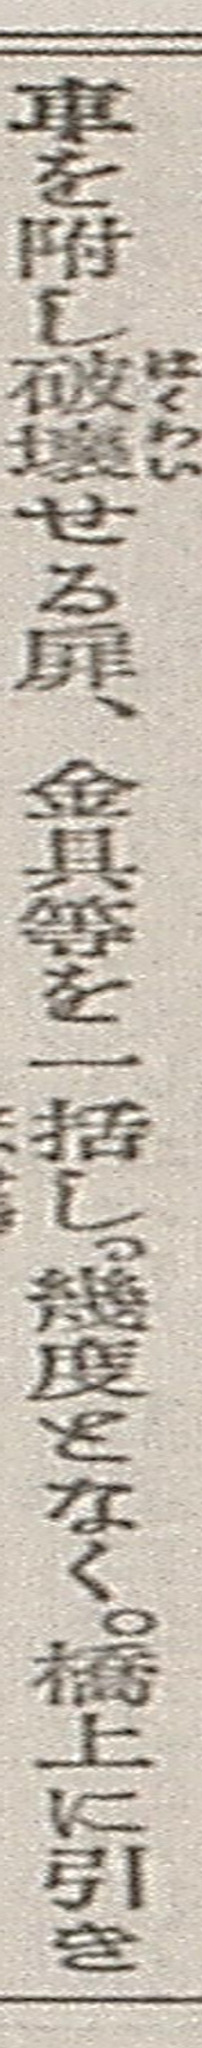車を附し破壊せる扉、金具等を一括し。幾度となく。橋上に引き
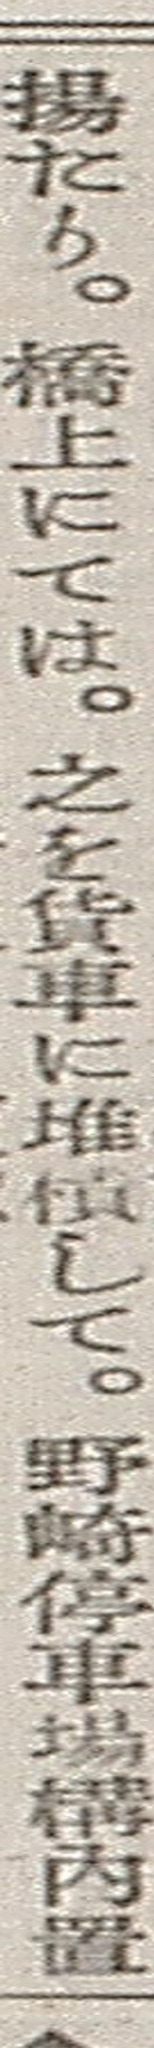揚たり。橋上にては。之を貨車に堆積して。野崎停車場構内置
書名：風俗畫報臨時増刊第百九十九號　明治三十二年十月各地災害圖會（前編之續）
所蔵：東京大学地震研究所図書室 Earthquake Research Institute Library, The University of Tokyo, JAPAN
